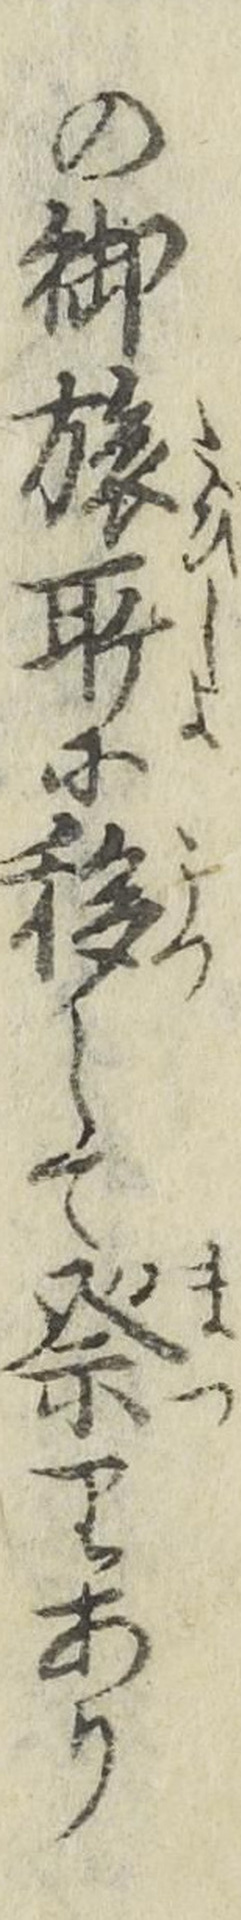の御旅所に移して祭りあり
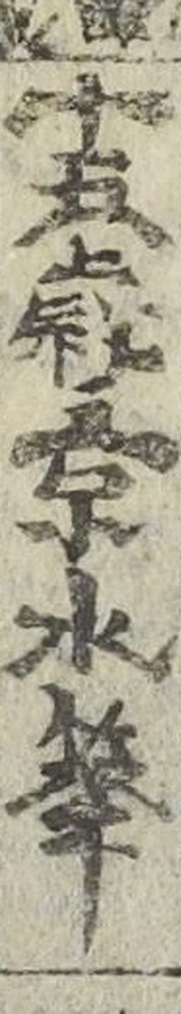十五歳京水筆
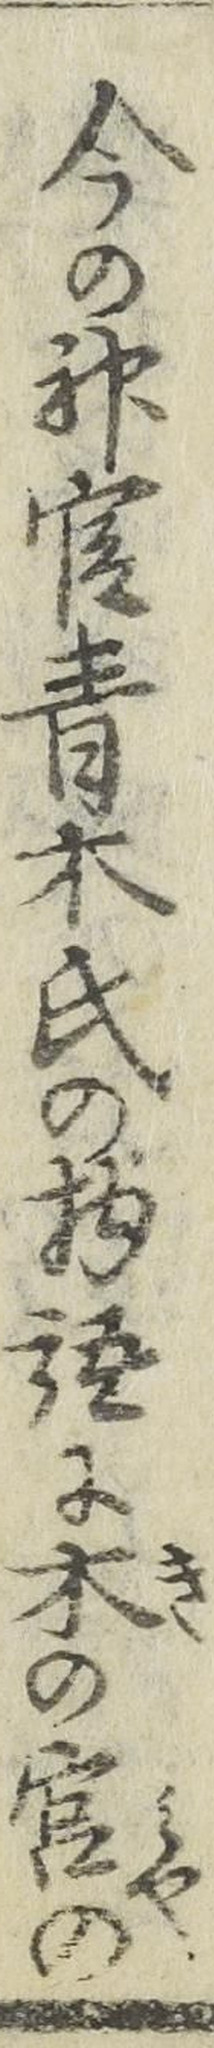今の神官青木氏の物語に木の宮の

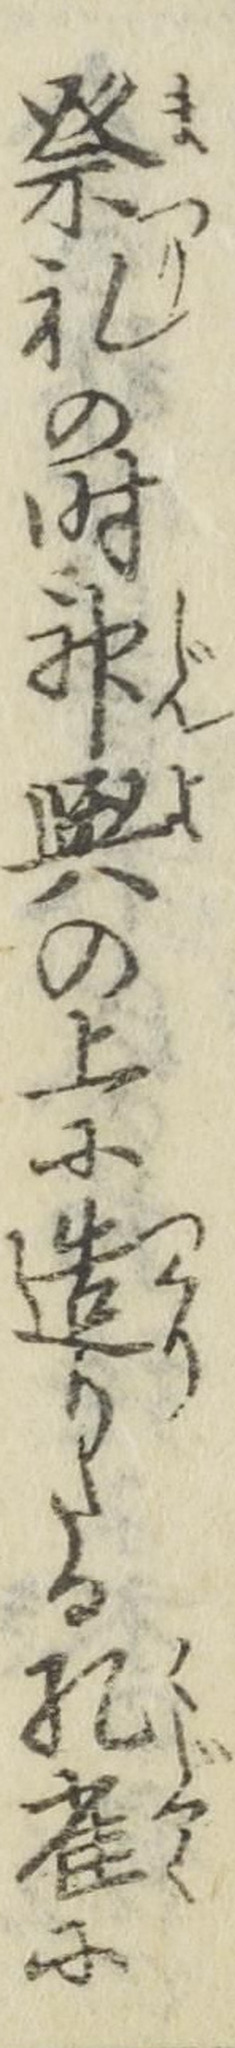祭礼の時神輿の上に造りたる孔雀に
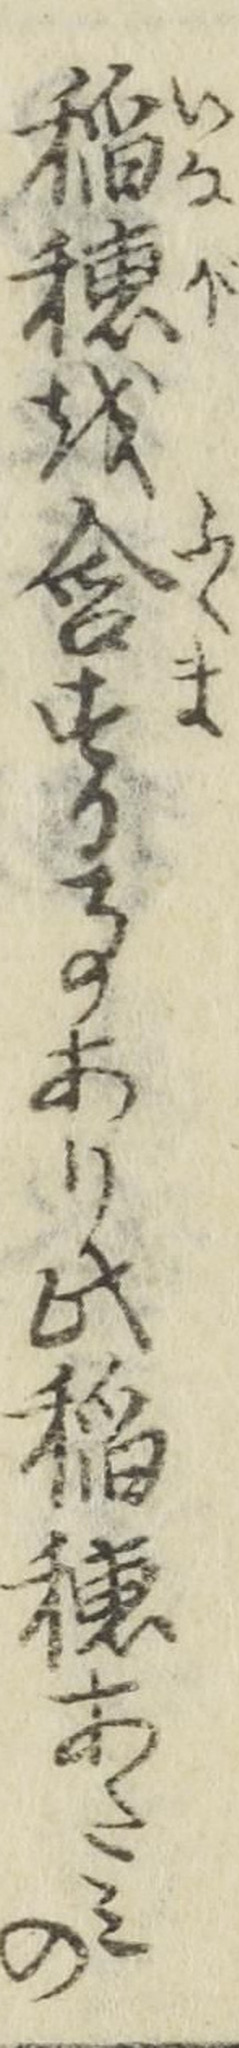稲穂を含する事あり此稲穂あたみの
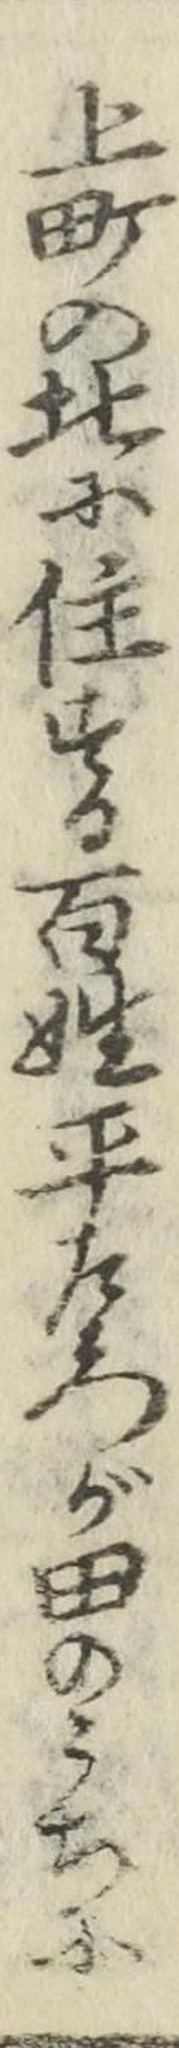上町の北に住する百姓平左衛門が田のうちに
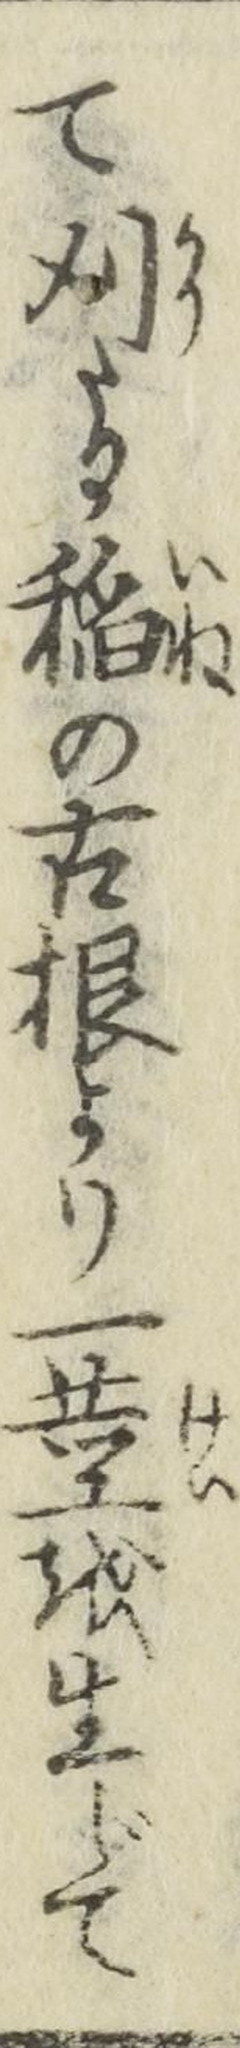て刈たる稲の古根より一茎を生じて
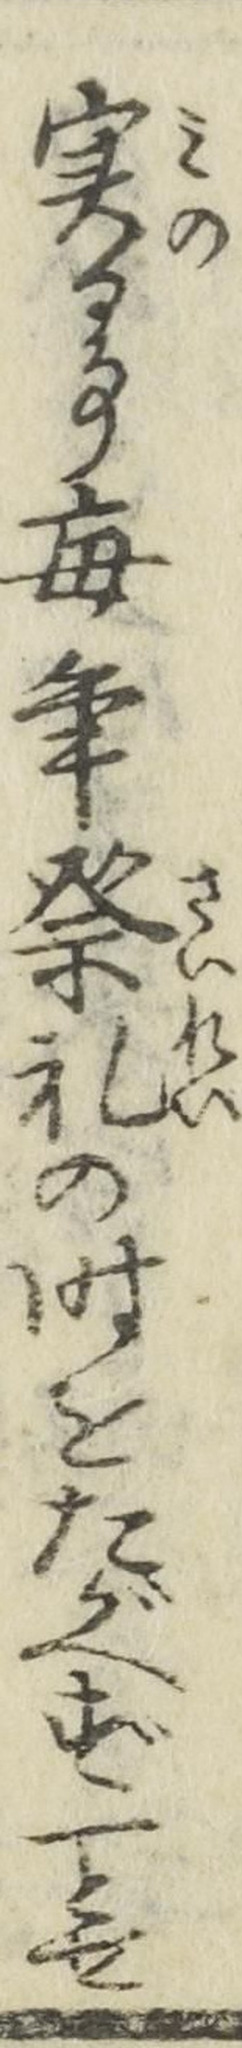実る事毎年祭礼の時をたがへず一とせ
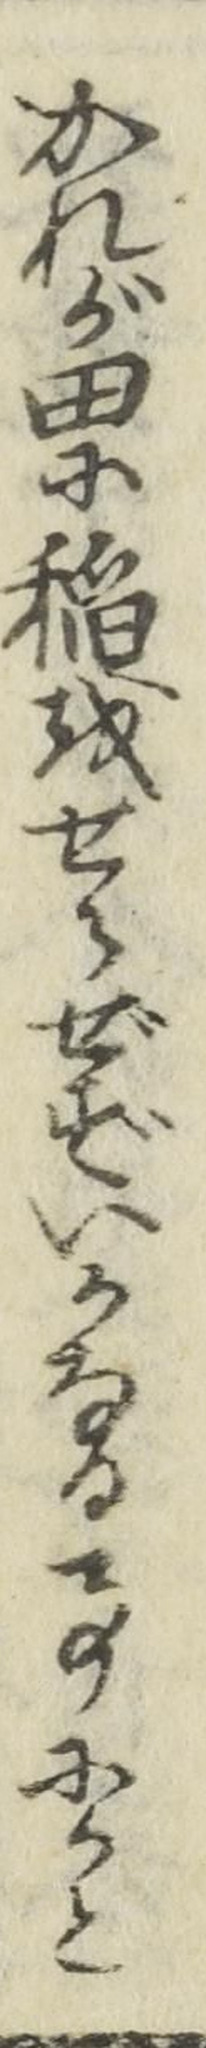かれが田に稲をせうぜずいかなる事にかと
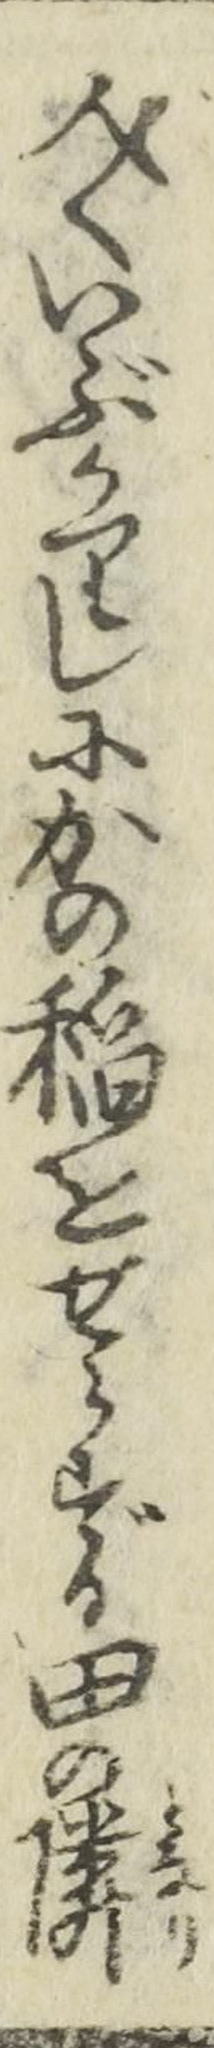人〳〵いぶかりしにかの稲をせうずる田の隣
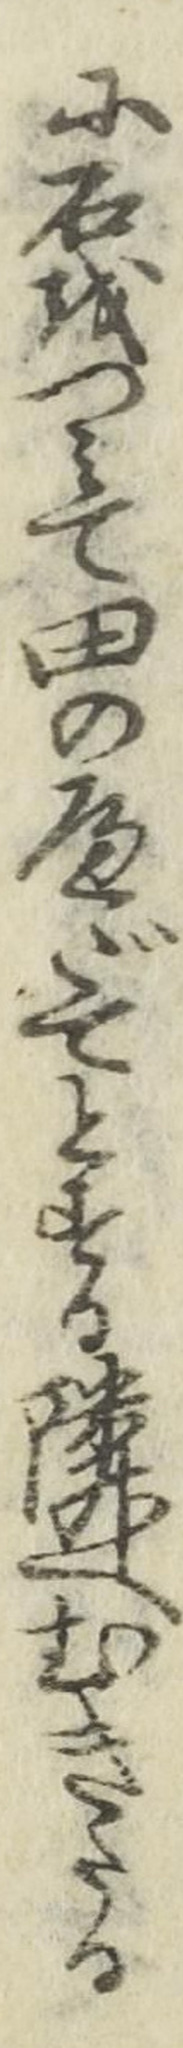に石をつみてたのへだてとする隣へむきたる
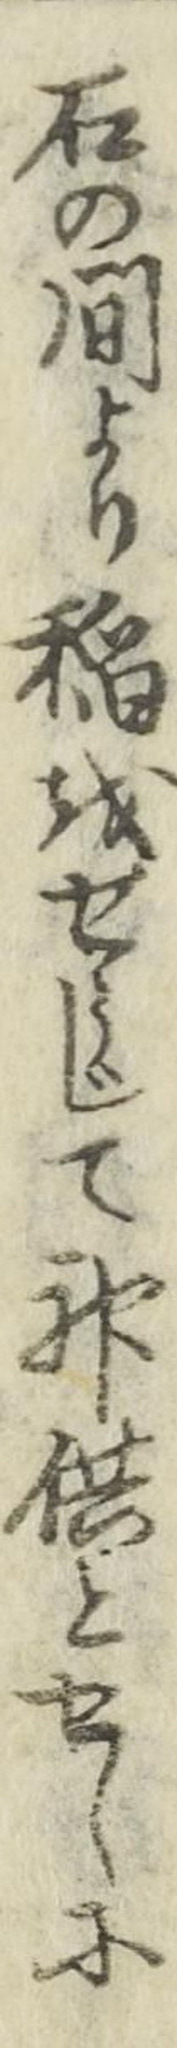石の間より稲をせうじて神供とせしに
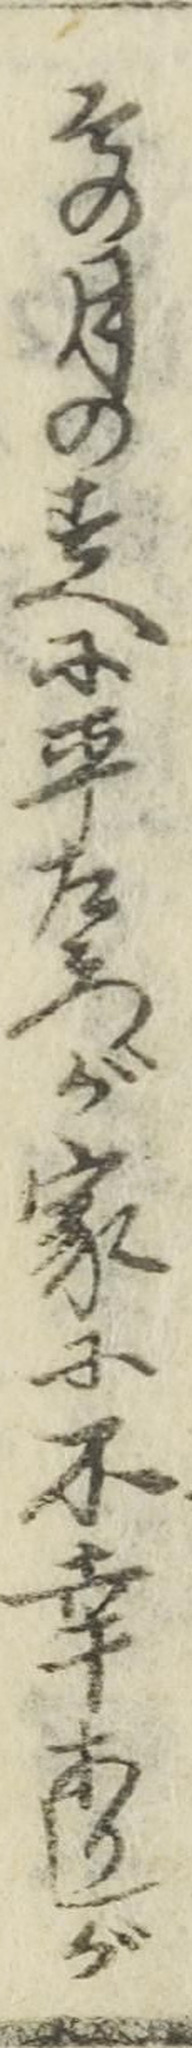その月のすへに平左衛門が家に不幸ありしが
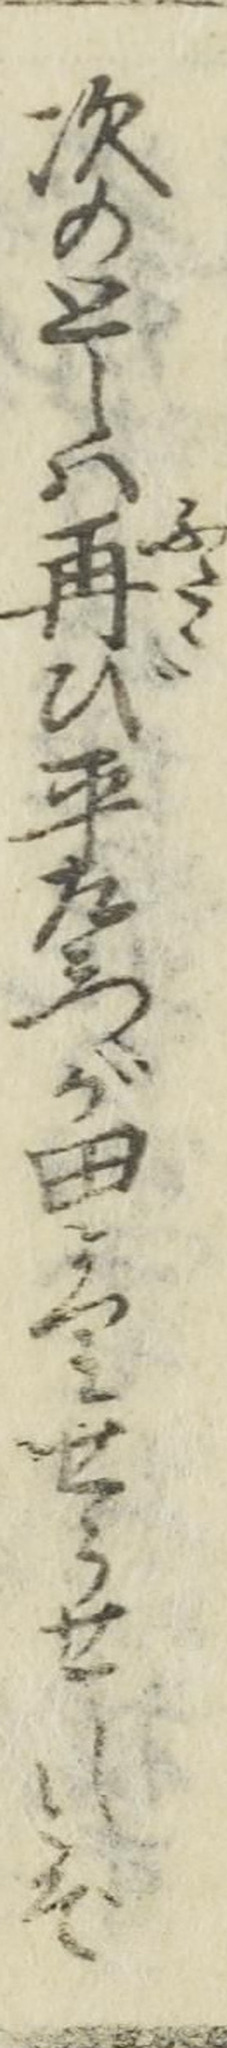次のとしは再び平左衛門が田よりせうせしとぞ
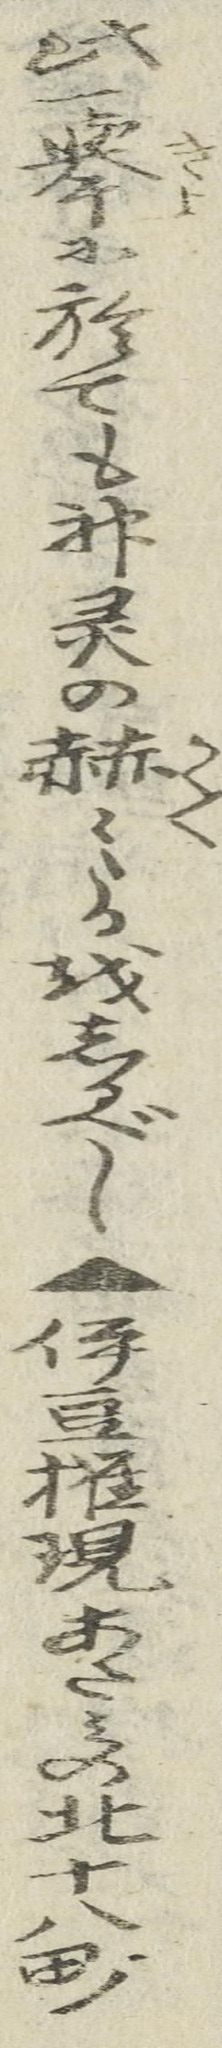此一挙に於ても神霊の赫々たるをしるべし▲伊豆権現あたみの北十八町
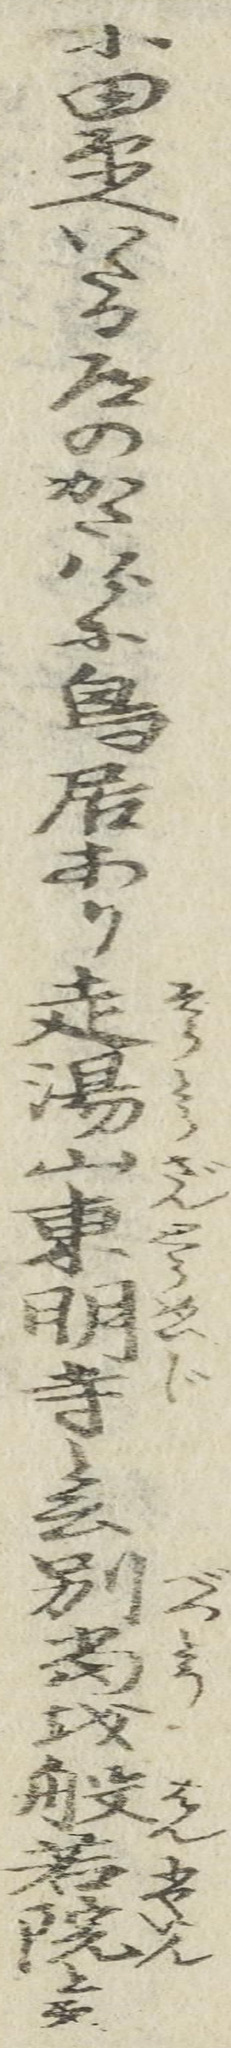小田原へいたる道のかたはらに鳥居あり走湯山東明寺と云別当を般若院と而
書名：熱海温泉圖彙
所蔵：東京大学地震研究所図書室 Earthquake Research Institute Library, The University of Tokyo, JAPAN
